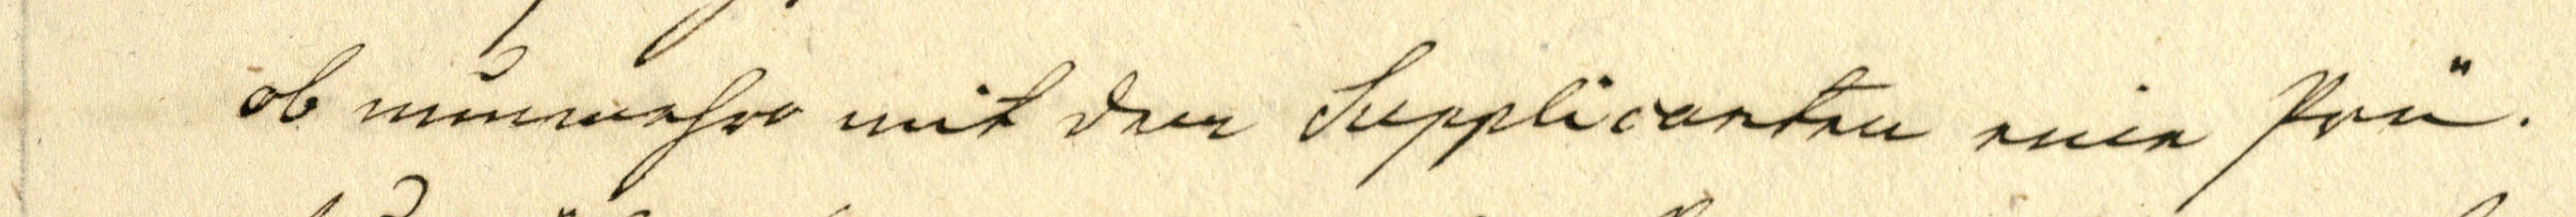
ob nunmehro mit dem Supplicanten eine Prü¬
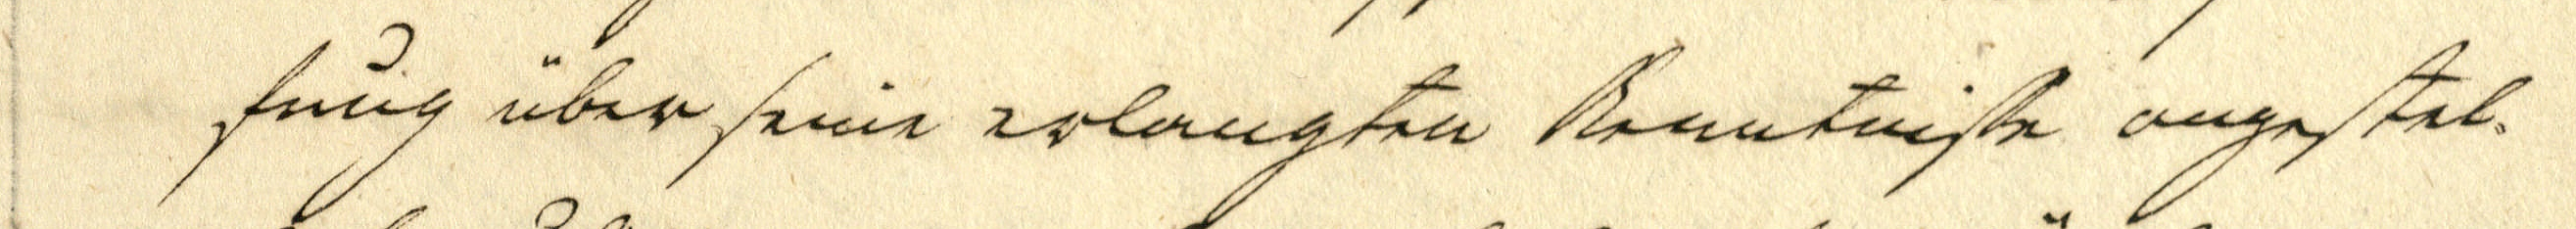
fung über seine erlangten Kenntnisse angestel¬
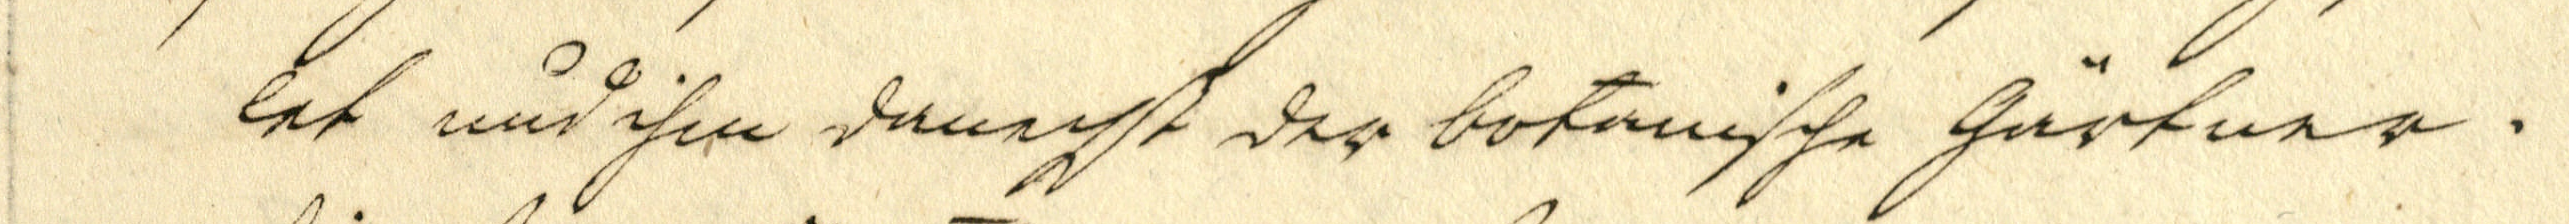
let und ihm danechst der botanische Gärtner¬
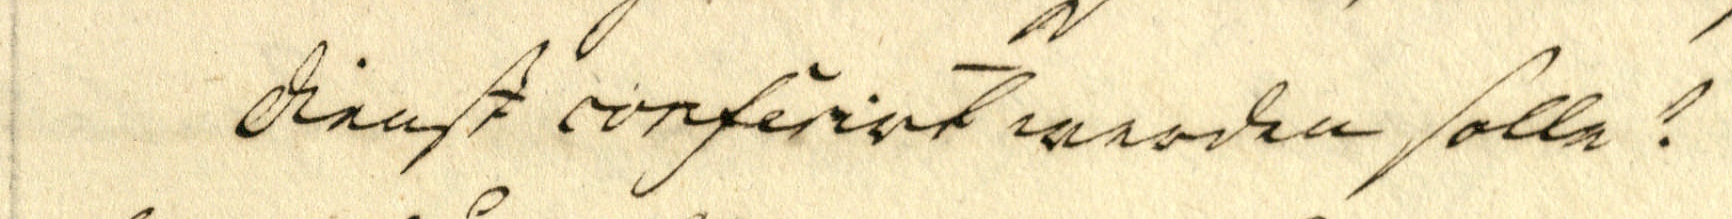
Dienst conferirt werden solle?
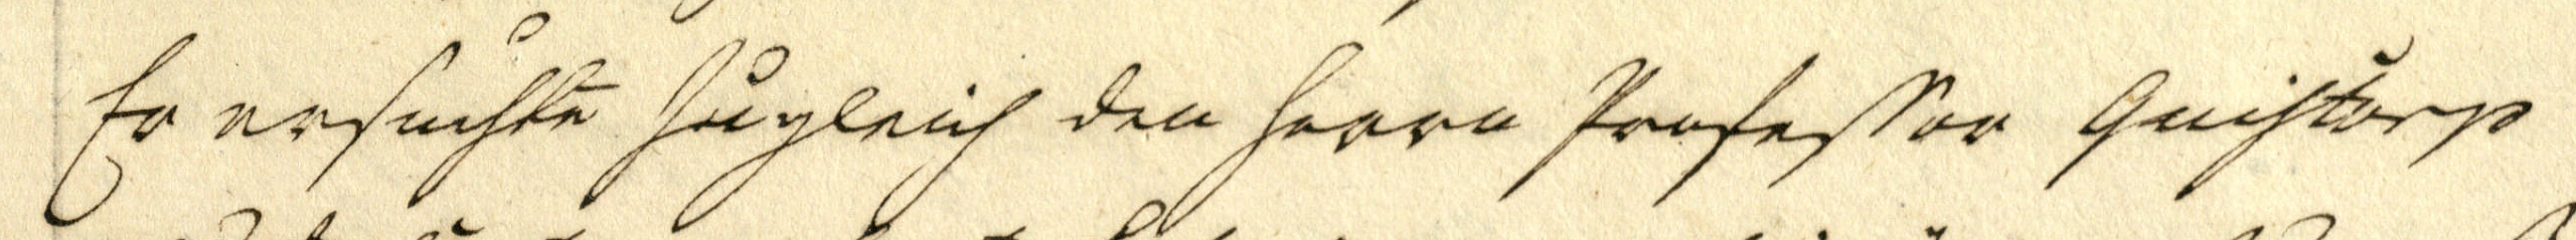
Er ersuchte zugleich den herrn Professor Quistorp
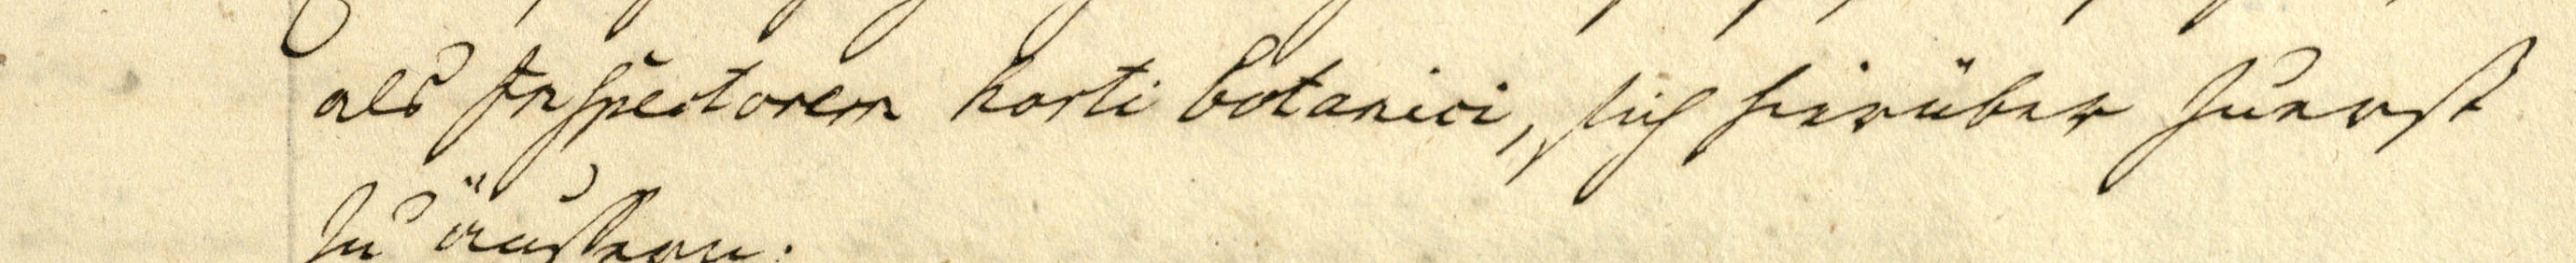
als Inspectorem horti botanici, sich hierüber zuerst
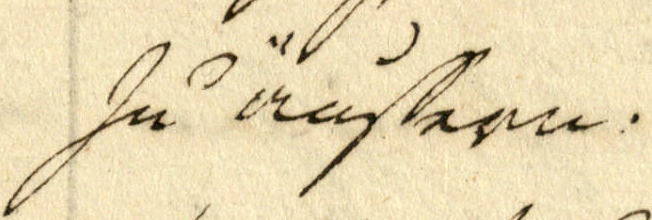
zu äussern.
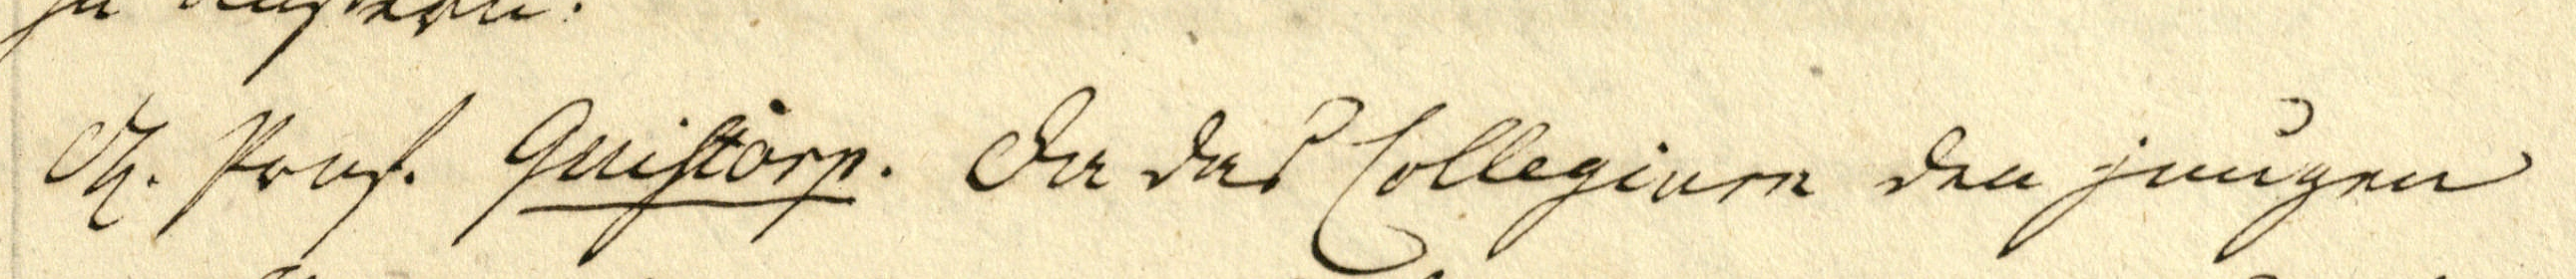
dh. Prof. Quistorp. Da das Collegium den jungen
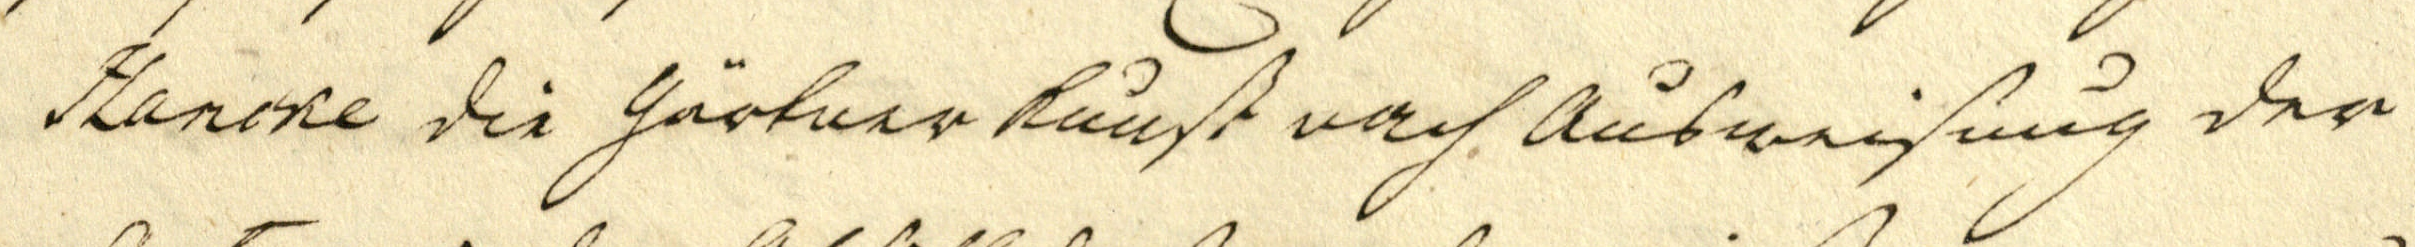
Hancke die Gärtner Kunst nach Ausweisung der
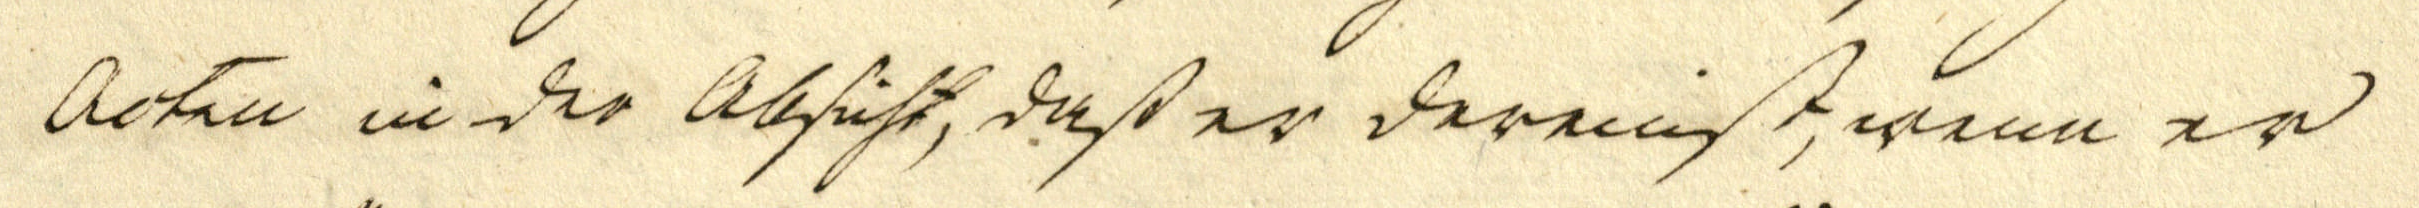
Acten in der Absicht, daß er dereinst, wenn er
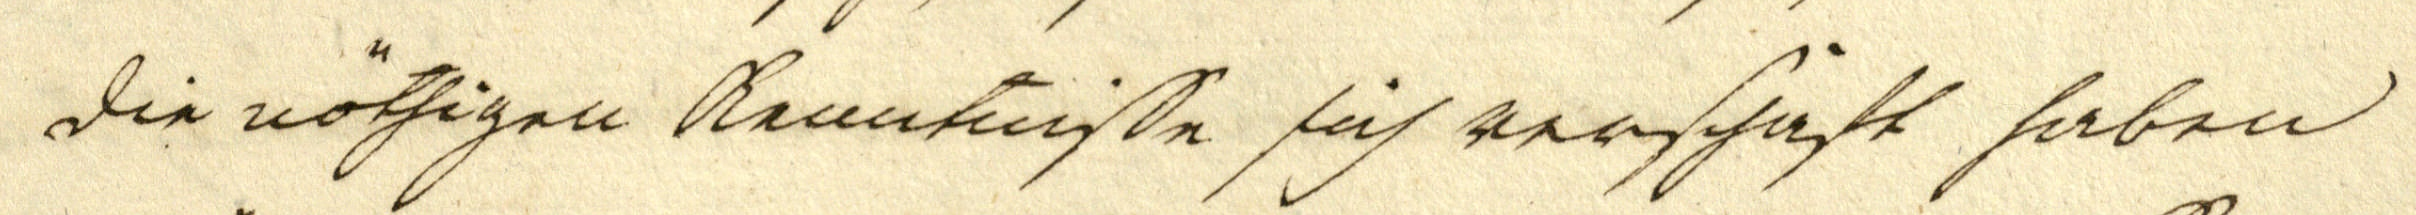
die nöthigen Kenntnisse sich verschaft haben
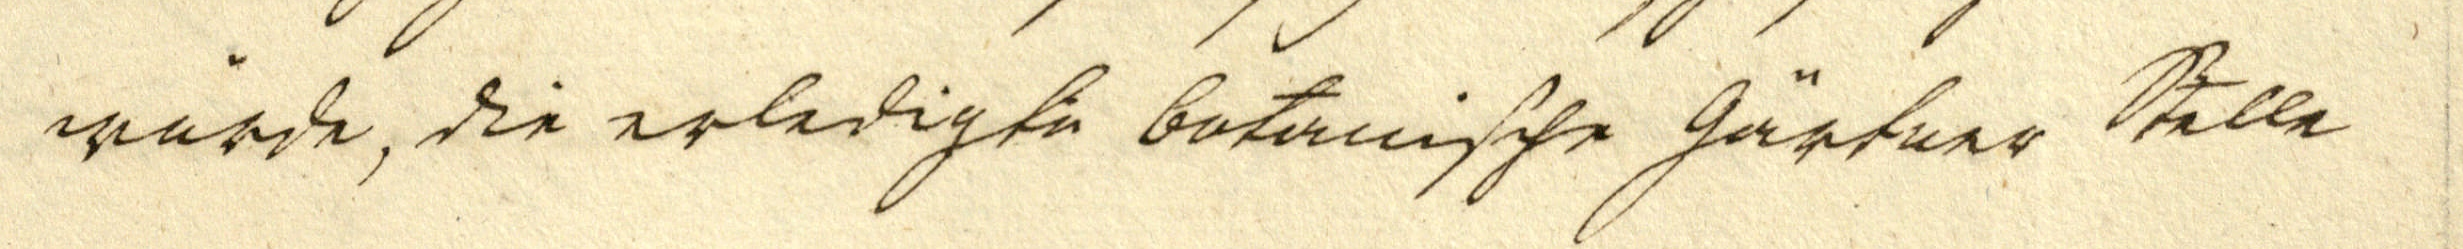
würde, die erledigte botanische Gärtner Stelle
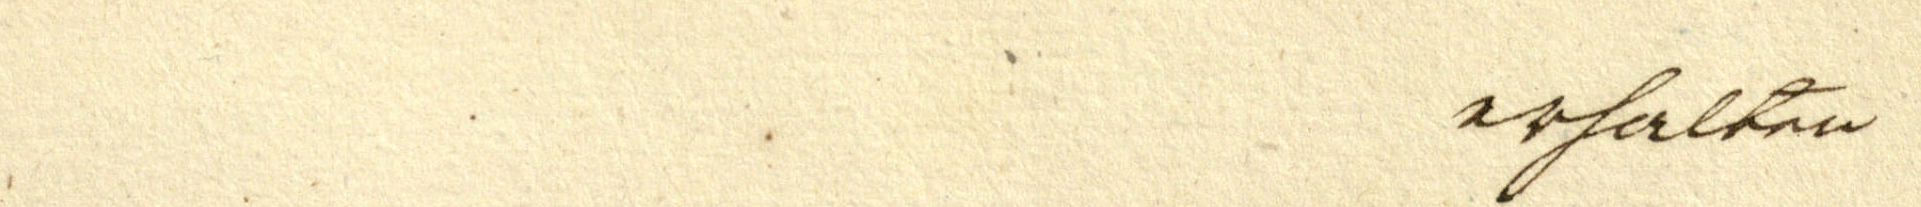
erhalten
